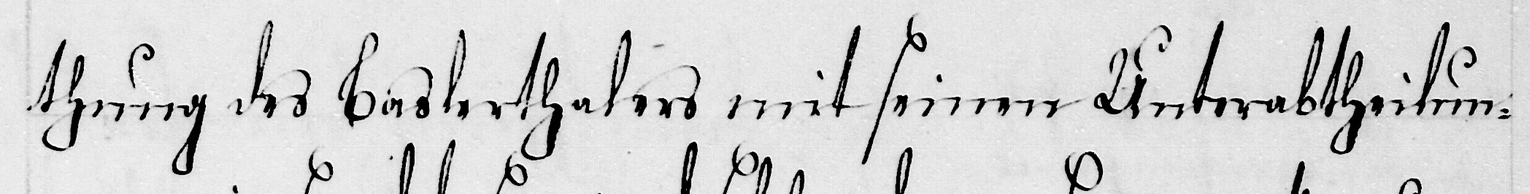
thung des Baslerthalers mit seinen Unterabtheilun¬
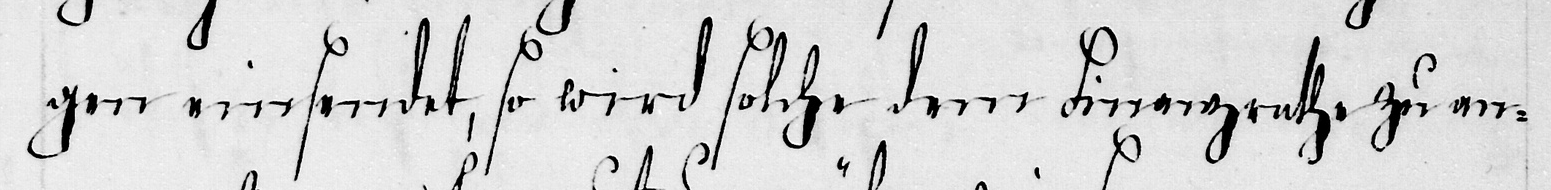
gen einsendet, so wird solche dem Finanzrathe zu an¬
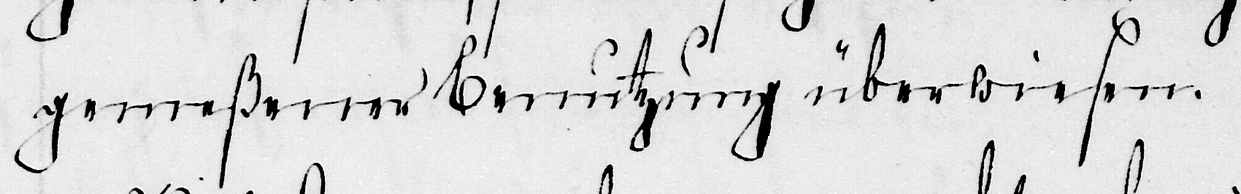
gemeßener Benutzung überwiesen.
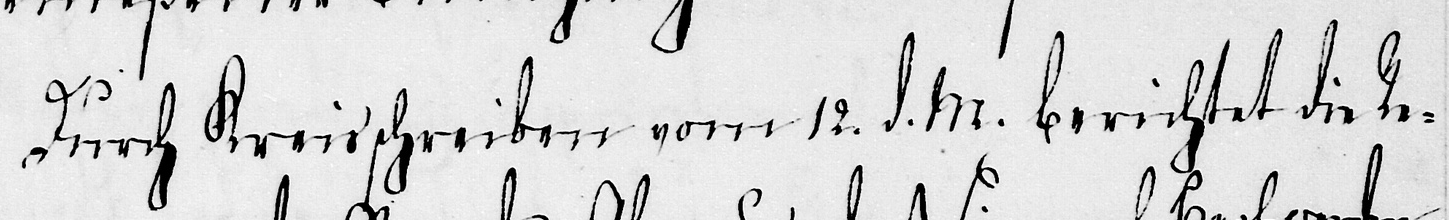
Durch Kreisschreiben vom 12. d. M. berichtet die R¬
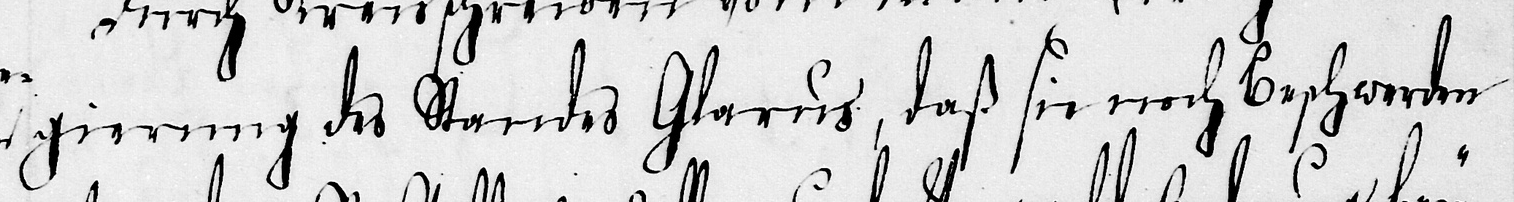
egierung des Standes Glarus, daß sie noch Beschwerden
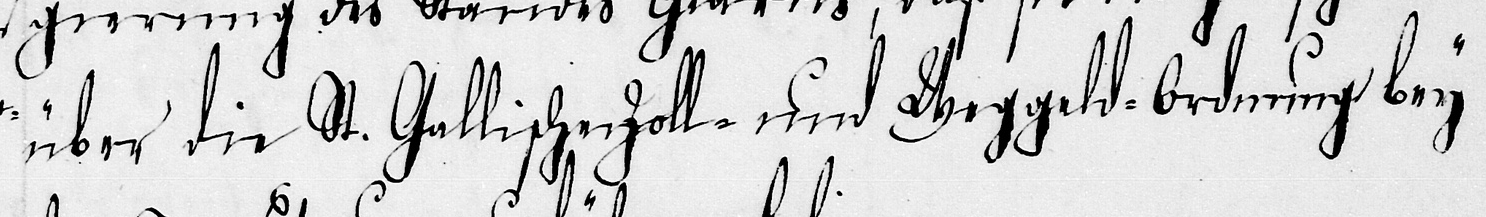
über die St. Gallische Zoll- und Weggeld-Ordnung bey
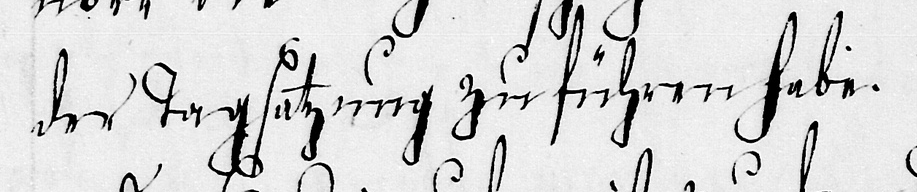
der Tagsatzung zu führen habe.
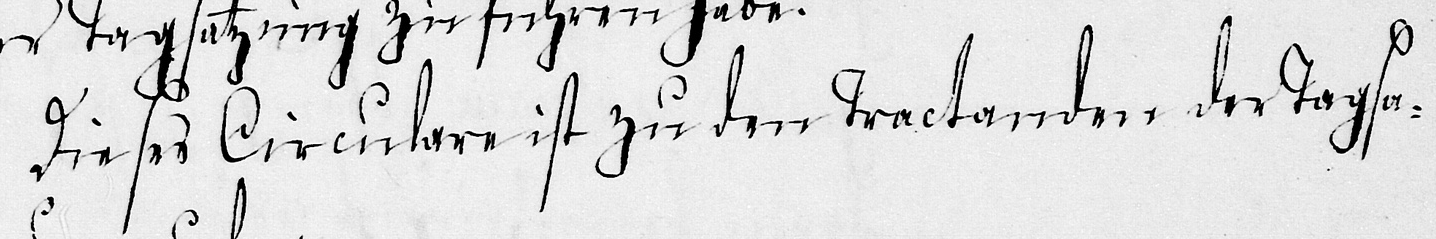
Dieses Circulare ist zu den Tractanden der Tagsa¬
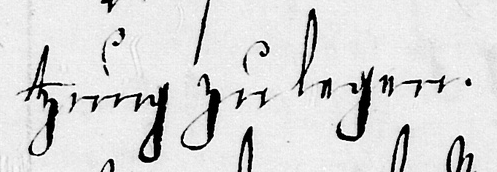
tzung zu legen.
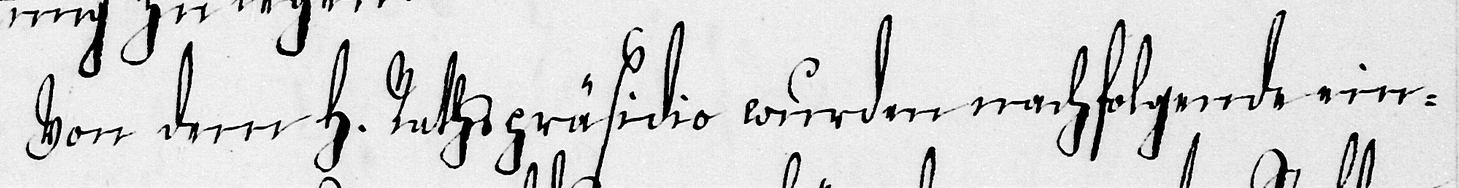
Von dem H. Rathspräsidio wurden nachfolgende ein¬
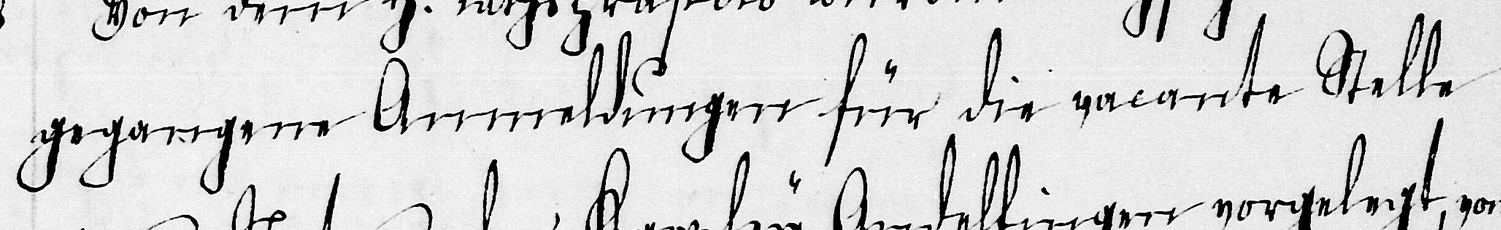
gegangene Anmeldungen für die vacante Stelle
